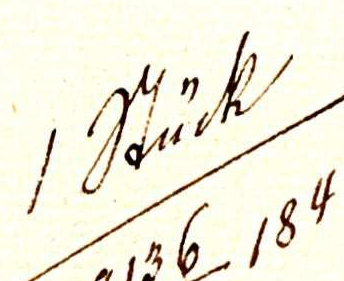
1 Stück
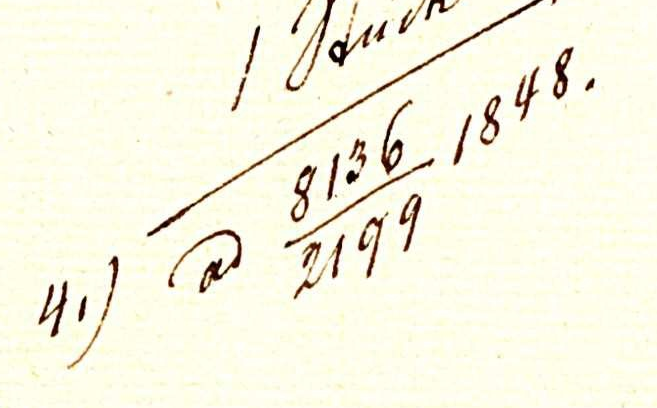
4.) ad 8136/2199 1848.
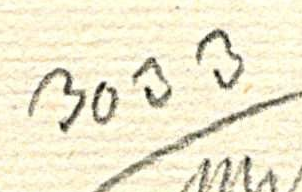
3033
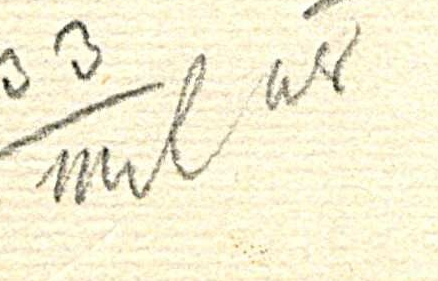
M R 48
